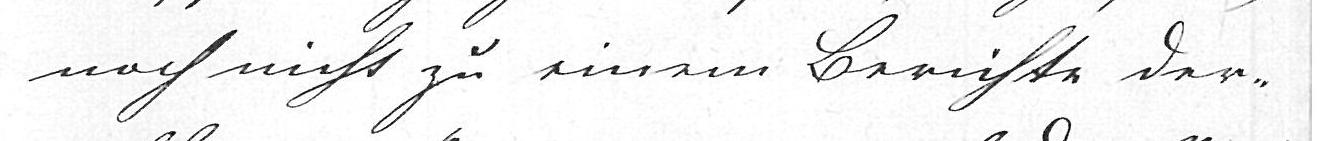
noch nicht zu einem Berichte der-
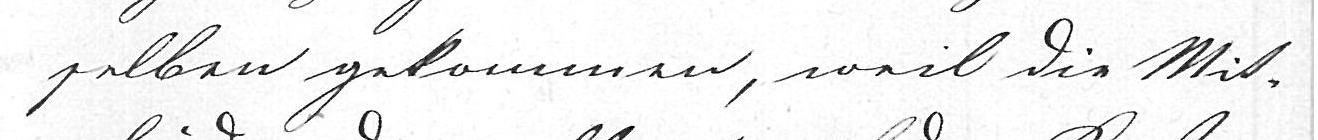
selben gekommen, weil die Mit-
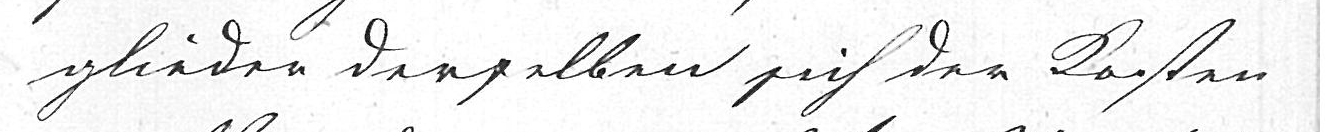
glieder derselben sich der Kosten
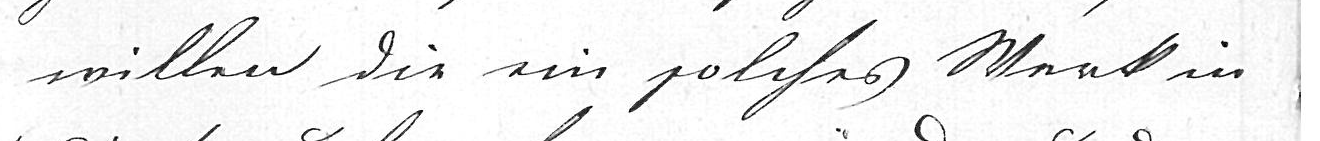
willen die ein solche Werk in
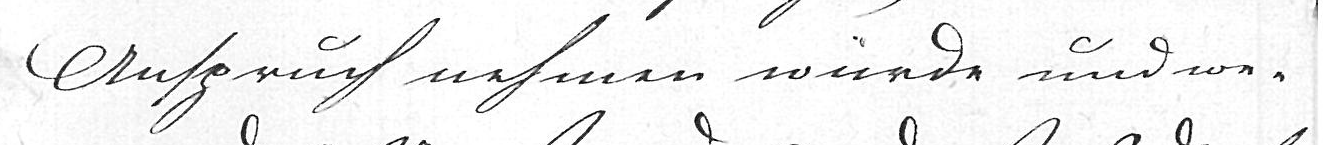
Anspruch nehmen würde und we-
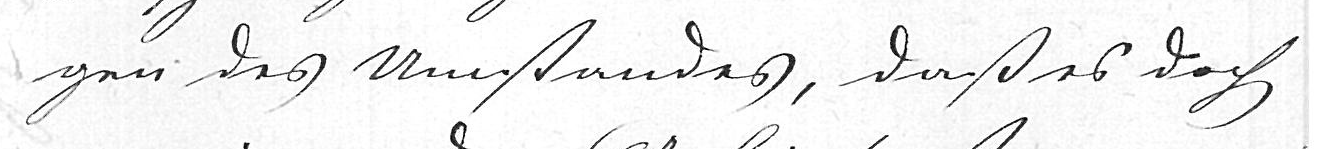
gen des Umstandes, daß es doch
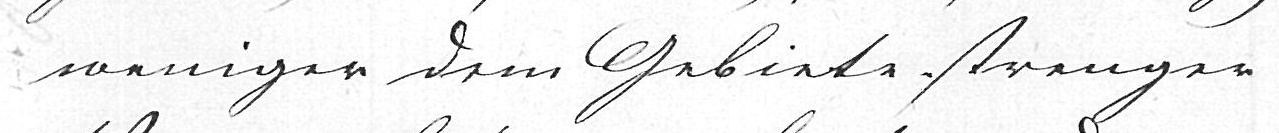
weniger dem Gebiete strenger
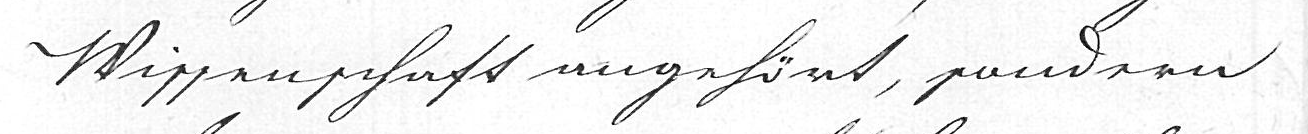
Wissenschaft angehört, sondern
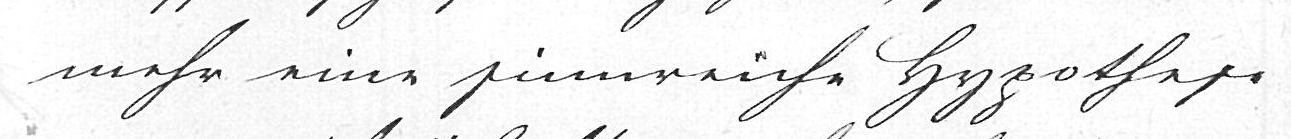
mehr eine sinnreiche Hypothese
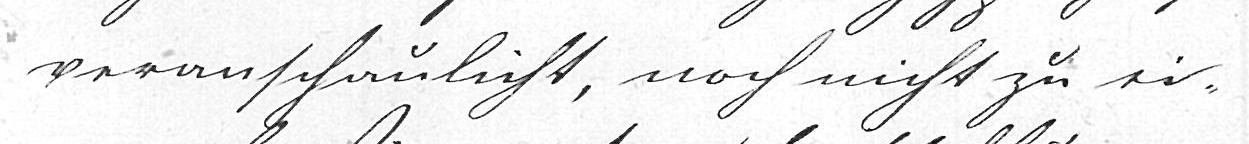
veranschaulicht, noch nicht zu ei-
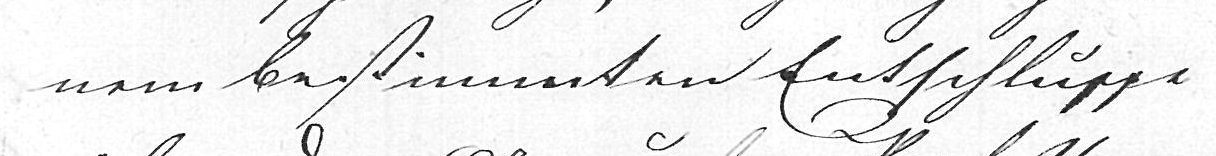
nem bestimmten Entschlusse
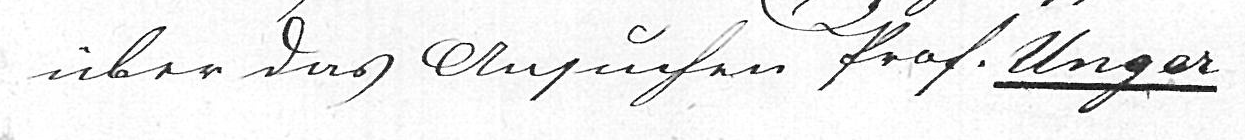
über das Ansuchen Prof. Unger
